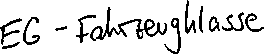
EG-Fahrzeugklasse
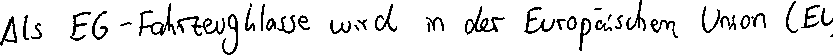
Als EG-Fahrzeugklasse wird in der Europäischen Union (EU
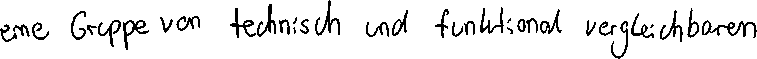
eine Gruppe von technisch und funktional vergleichbaren
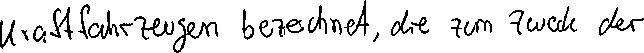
Kraftfahrzeugen bezeichnet, die zum Zweck der
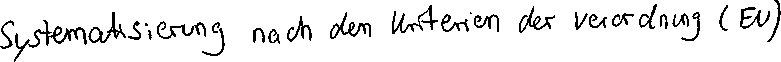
Systematisierung nach den Kriterien der Verordnung (EU)
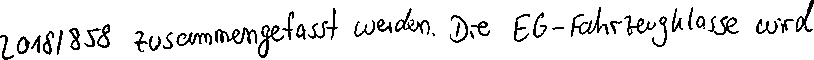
2018/858 zusammengefasst werden. Die EG-Fahrzeugklasse wird
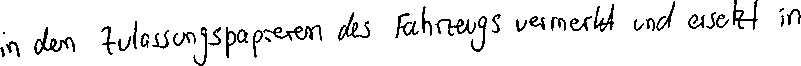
in den Zulassungspapieren des Fahrzeugs vermerkt und ersetzt in
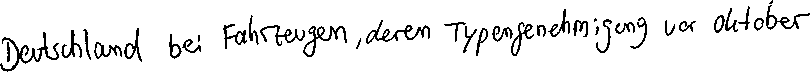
Deutschland bei Fahrzeugen, deren Typengenehmigung vor Oktober
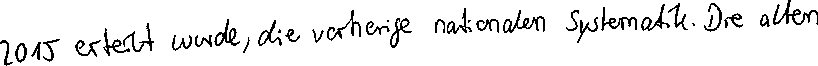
2015 erteilt wurde, die vorherige nationalen Systematik. Die alten
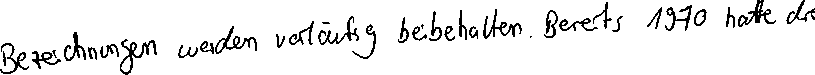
Bezeichnungen werden vorläufig beibehalten.Bereits 1970 hatte die
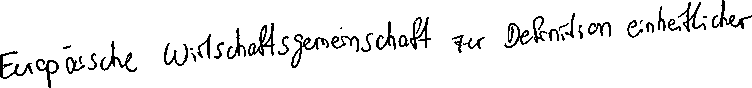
Europäische Wirtschaftsgemeinschaft zur Definition einheitlicher
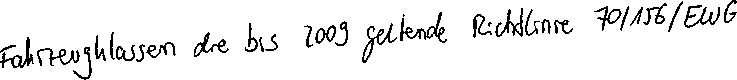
Fahrzeugklassen die bis 2009 geltende Richtlinie 70/156/EWG
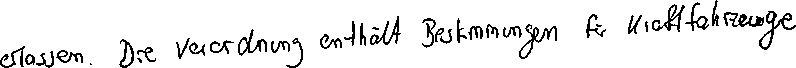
erlassen. Die Verordnung enthält Bestimmungen für Kraftfahrzeuge
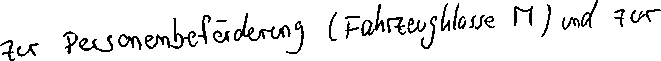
zur Personenbeförderung (Fahrzeugklasse M) und zur
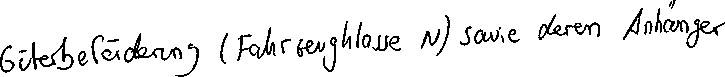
Güterbeförderung (Fahrzeugklasse N) sowie deren Anhänger
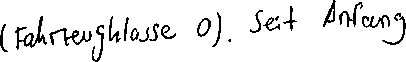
(Fahrzeugklasse O).Seit Anfang
